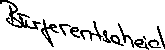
Bürgerentscheid
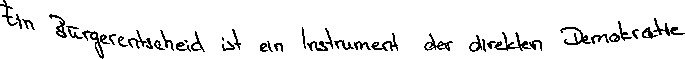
in Bürgerentscheid ist ein Instrument der direkten Demokratie
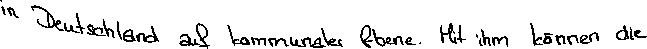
in Deutschland auf kommunaler Ebene.Mit ihm können die
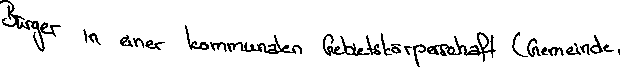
Bürger in einer kommunalen Gebietskörperschaft (Gemeinde,
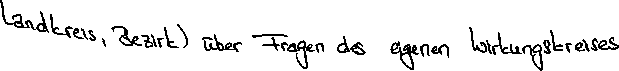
(Gemeinde, Landkreis, Bezirk) über Fragen des eigenen Wirkungskreises
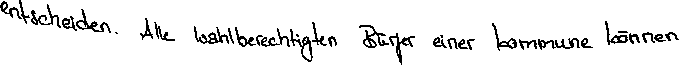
entscheiden. Alle wahlberechtigten Bürger einer Kommune können
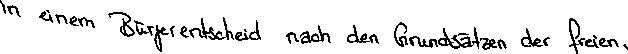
in einem Bürgerentscheid nach den Grundsätzen der freien,
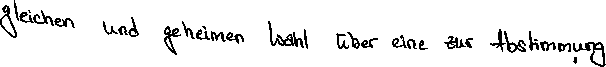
gleichen und geheimen Wahl über eine zur Abstimmung
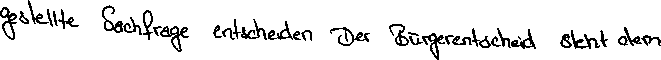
gestellte Sachfrage entscheiden. Der Bürgerentscheid steht dem
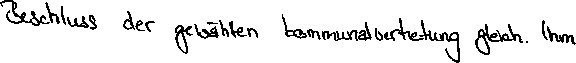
Beschluss der gewählten Kommunalvertretung gleich. Ihm
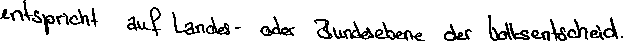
entspricht auf Landes- oder Bundesebene der Volksentscheid.
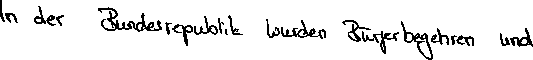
In der Bundesrepublik wurden Bürgerbegehren und
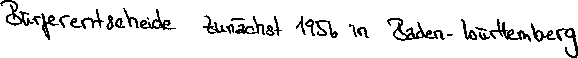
Bürgerentscheide zunächst 1956 in Baden-Württemberg
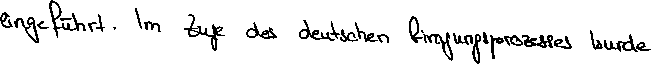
eingeführt. Im Zuge des deutschen Einigungsprozesses wurde
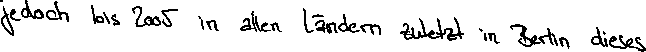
jedoch bis 2005 in allen Ländern zuletzt in Berlin dieses
